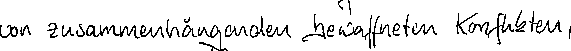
von zusammenhängenden bewaffneten Konflikten,
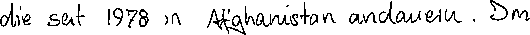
die seit 1978 in Afghanistan andauern. Im
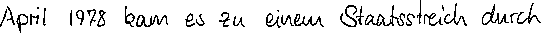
April 1978 kam es zu einem Staatsstreich durch
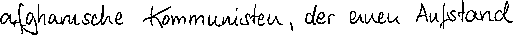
afghanische Kommunisten, der einen Aufstand
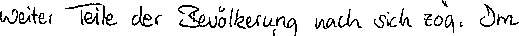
weiter Teile der Bevölkerung nach sich zog. Im
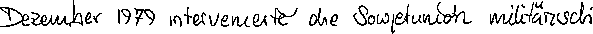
Dezember 1979 intervenierte die Sowjetunion militärisch
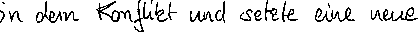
in dem Konflikt und setzte eine neue
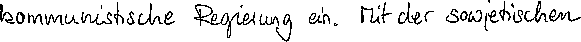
kommunistische Regierung ein. Mit der sowjetischen
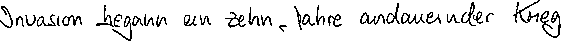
Invasion begann ein zehn Jahre andauernder Krieg
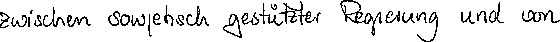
zwischen sowjetisch gestützter Regierung und von
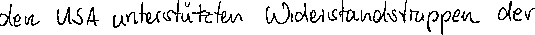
den USA unterstützten Widerstandsgruppen der
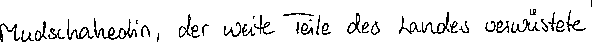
Mudschahedin, der weite Teile des Landes verwüstete.
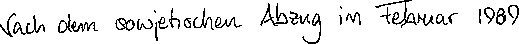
Nach dem sowjetischen Abzug im Februar 1989
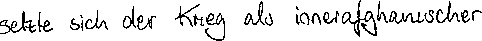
setzte sich der Krieg als innerafghanischer
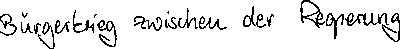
Bürgerkrieg zwischen der Regierung
